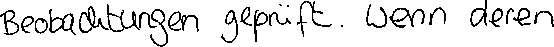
Beobachtungen geprüft. Wenn deren
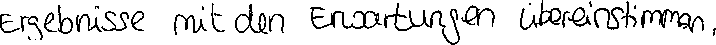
Ergebnisse mit den Erwartungen übereinstimmen,
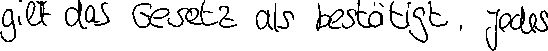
gilt das Gesetz als bestätigt. Jedes
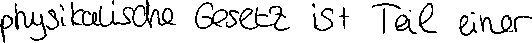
physikalische Gesetz ist Teil einer
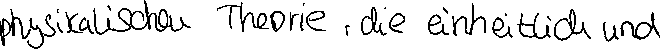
physikalischen Theorie, die einheitlich und
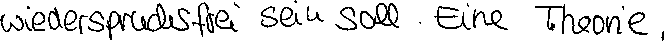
widerspruchsfrei sein soll. Eine Theorie,
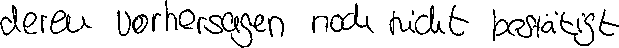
deren Vorhersagen noch nicht bestätigt
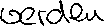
werden
